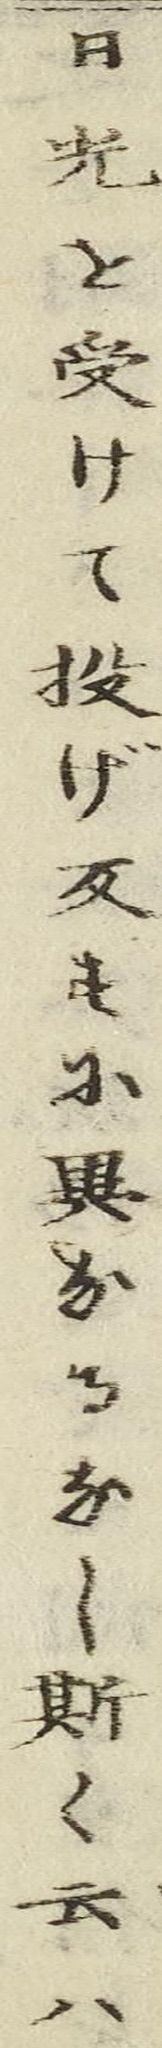日光を受けて投げ反すに異なるなし斯く云は
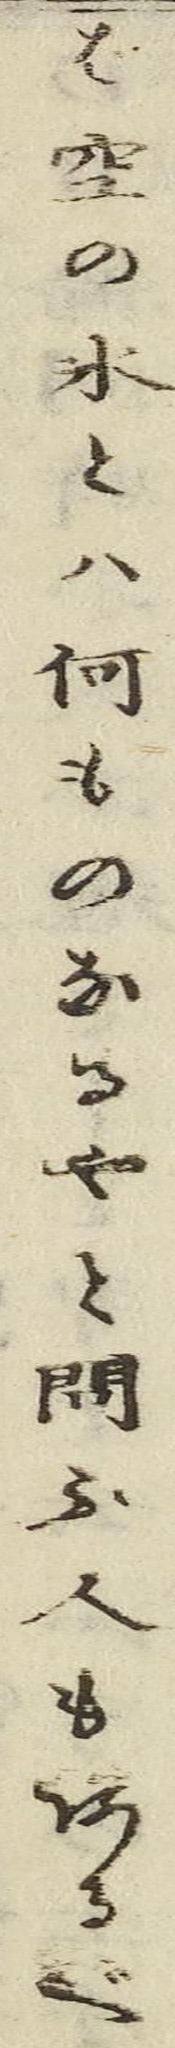ば空の氷とは何ものなるやと問ふ人もあるべ
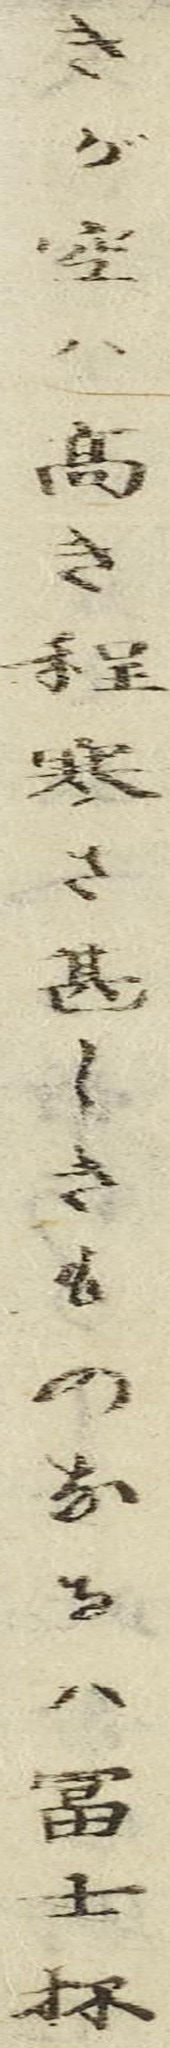きが空は高き程寒さ甚しきものなるは富士抔
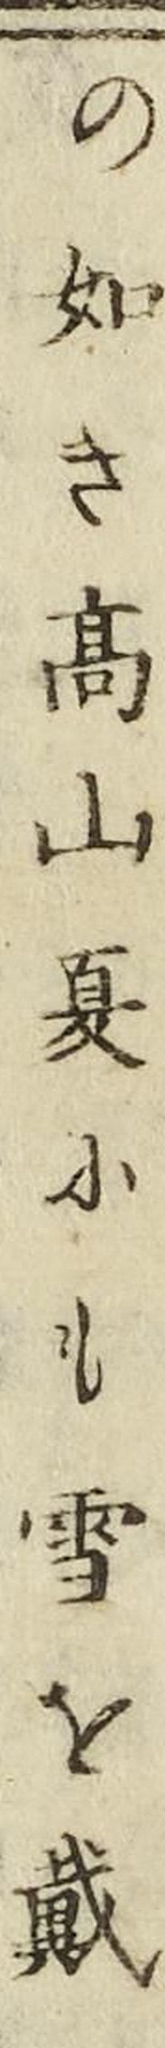の如き高山夏にも雪を戴
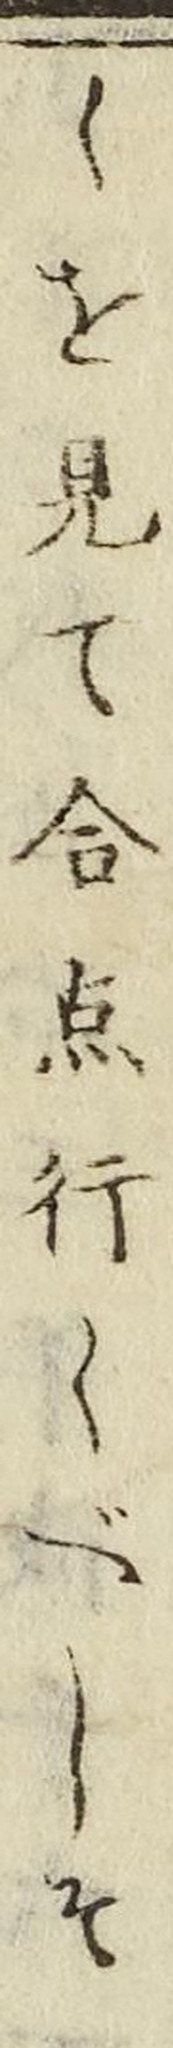くを見て合点行くべしそ
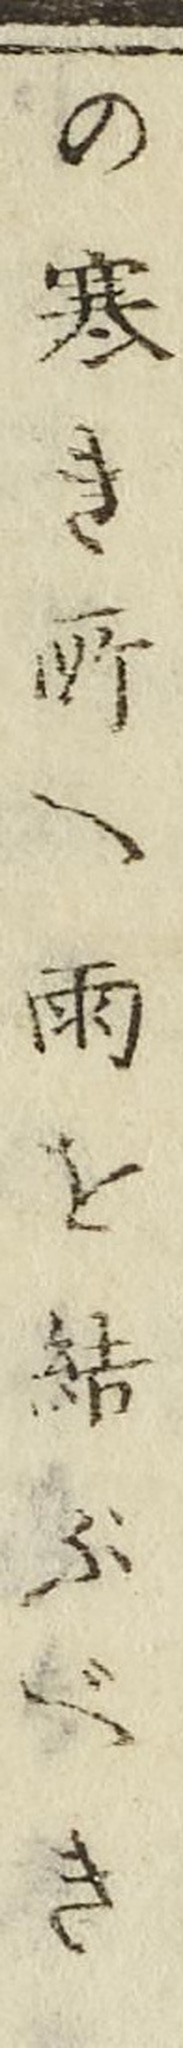の寒き所へ雨を結ぶべき
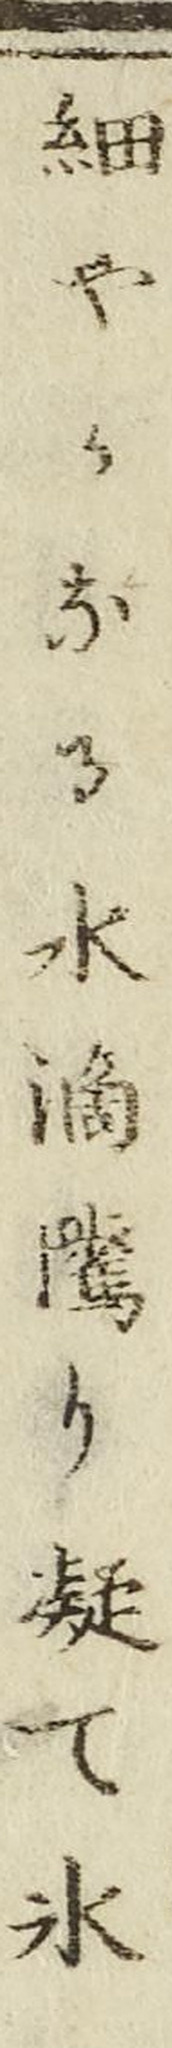細やかなる水滴騭り凝て氷
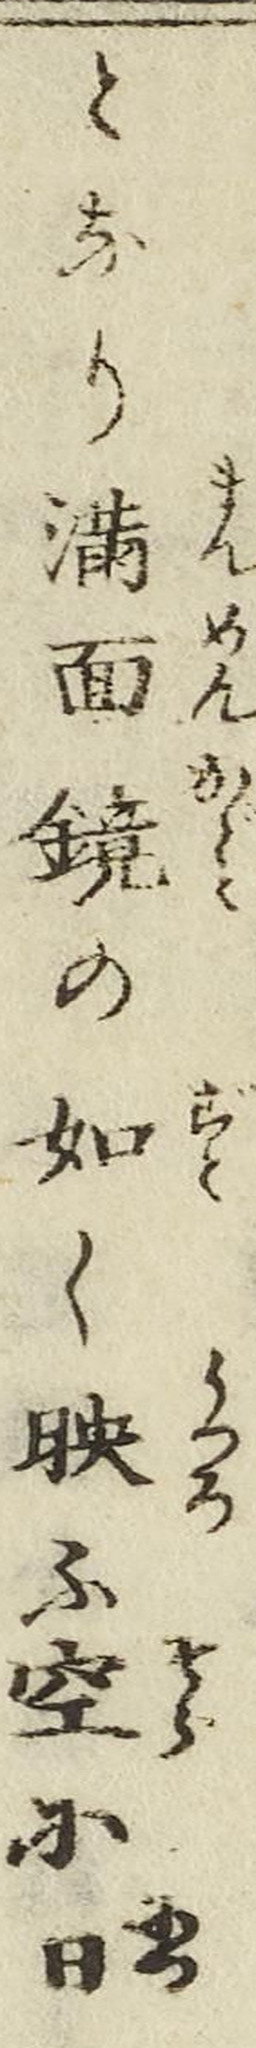となり満面鏡の如く映ふ空に日
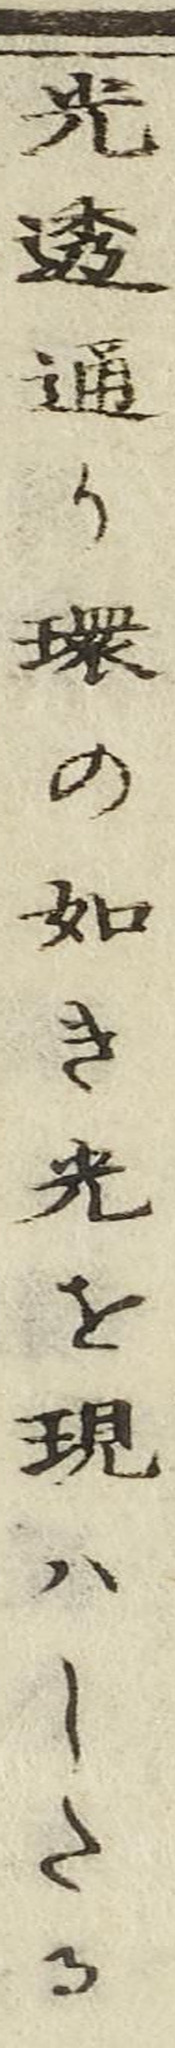光透通り環の如き光を現はしたる
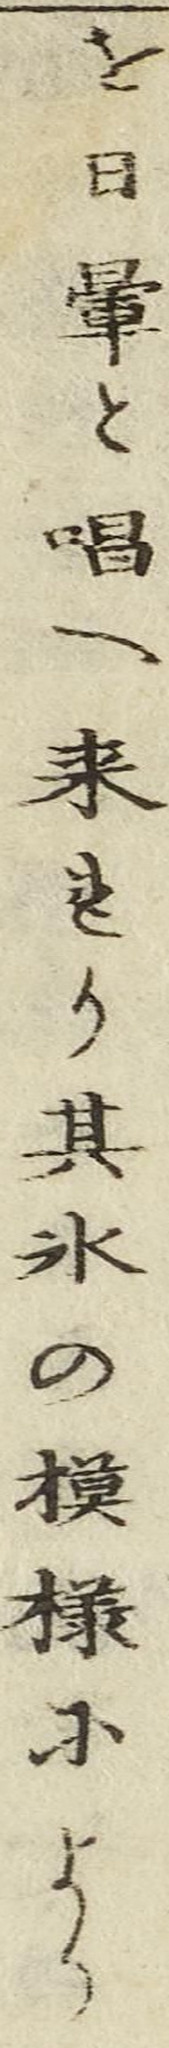を日暈と唱へ来れり其氷の模様により
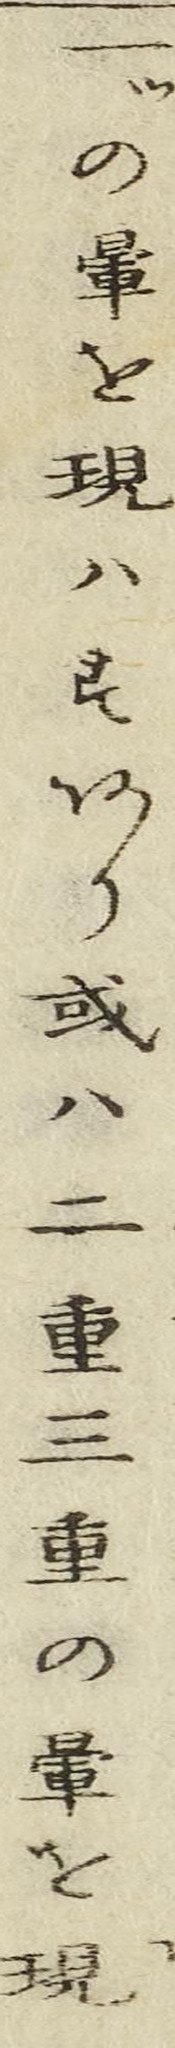一つの暈を現はすあり或は二重三重の暈を現
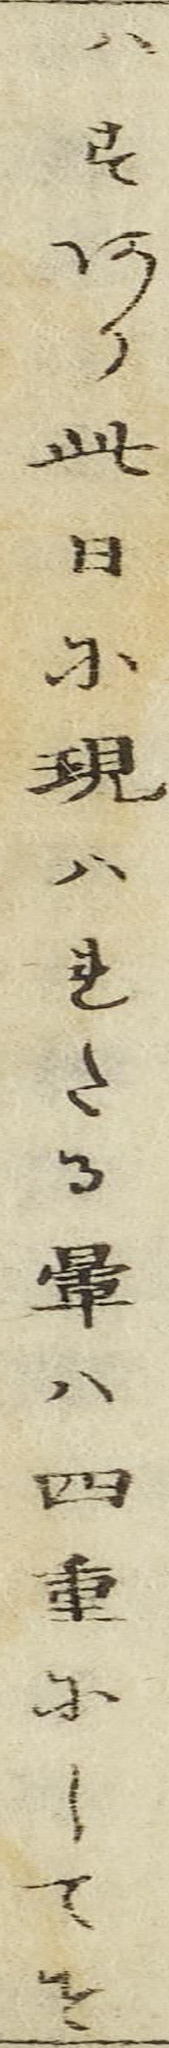はすあり此日に現はれたる暈は四重にしてそ

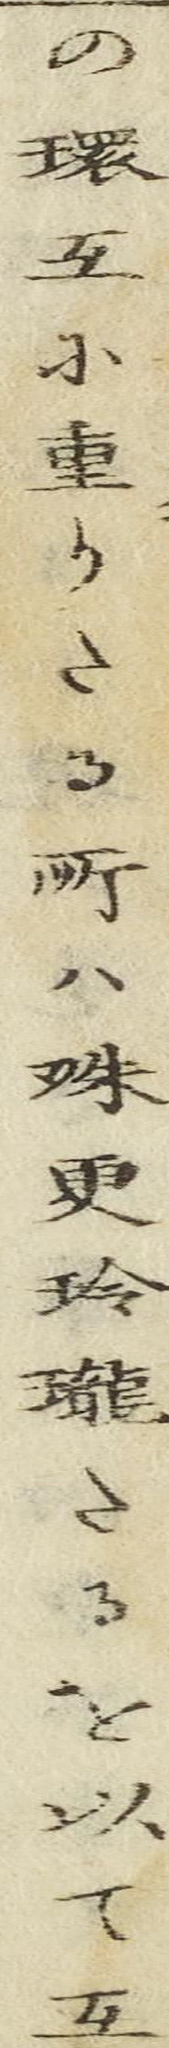の環互に重りたる所は殊更玲瓏たるを以て互
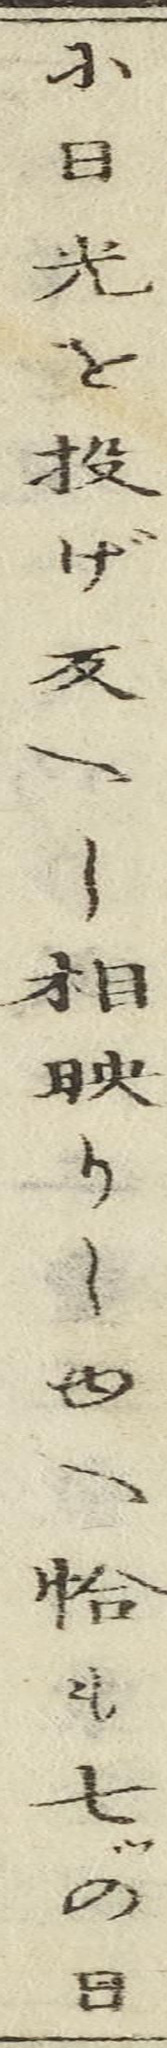に日光を投げ反へし相映りしゆへ恰も七つの日
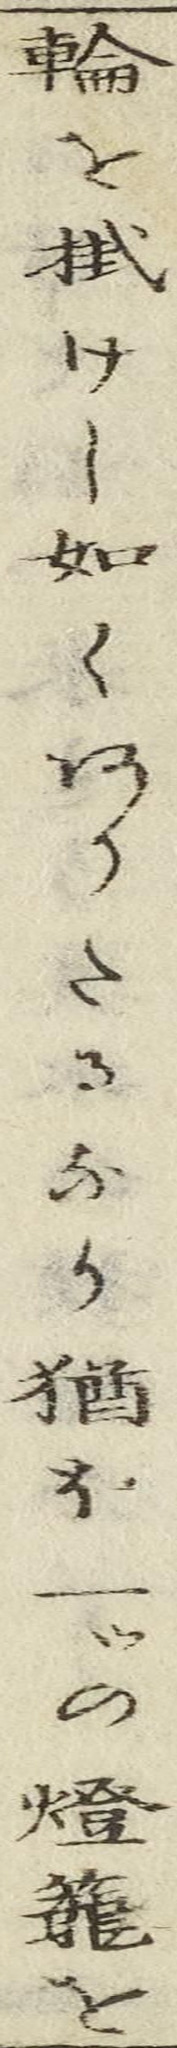輪を掛けし如くありたるなり猶ほ一つの灯籠を
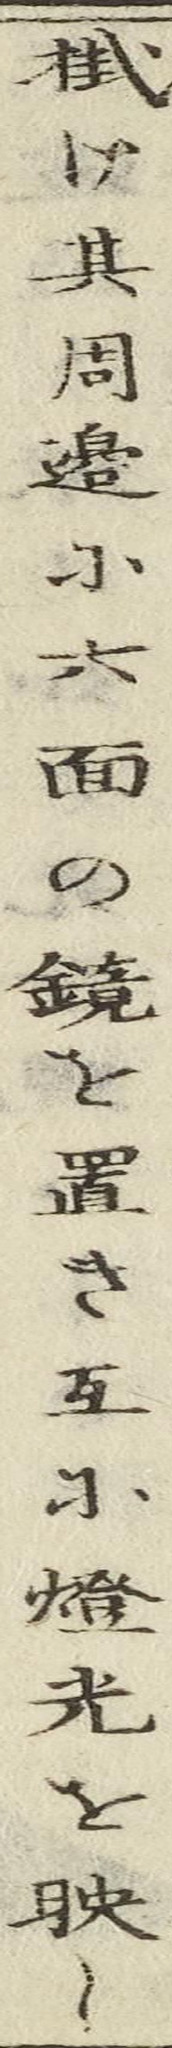掛け其周辺に六面の鏡を置き互に灯光を映し
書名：天変地異
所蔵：東京大学地震研究所図書室 Earthquake Research Institute Library, The University of Tokyo, JAPAN
